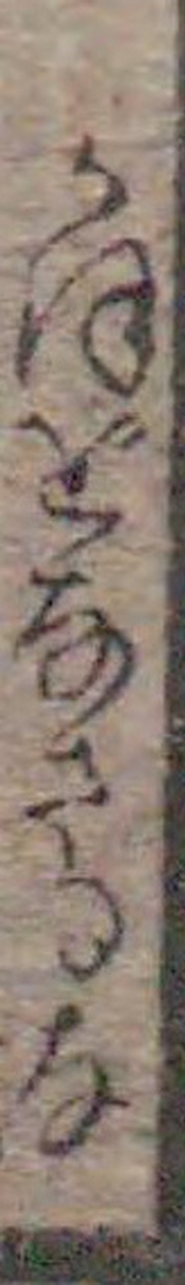かほをなさるな
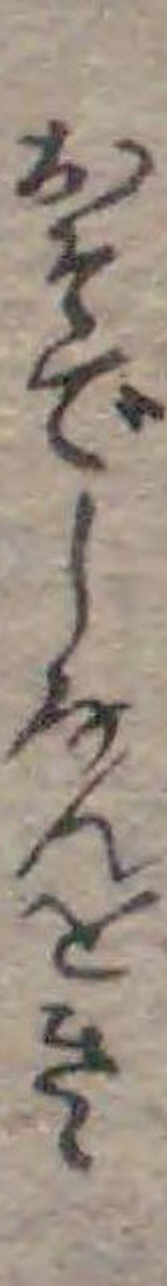おそでしなんをきゝ
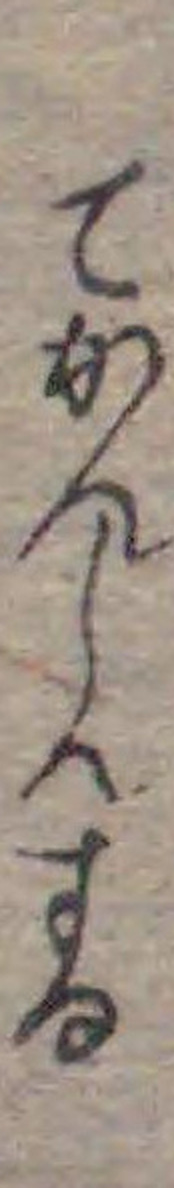てかんしんする

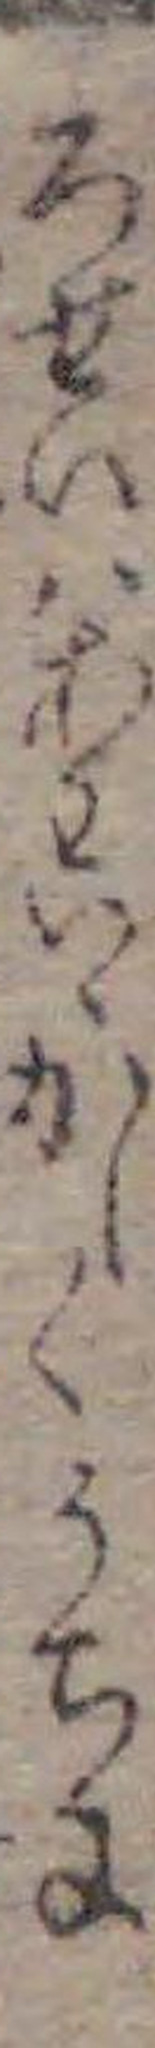ろせいはあわいゝかしくうちに
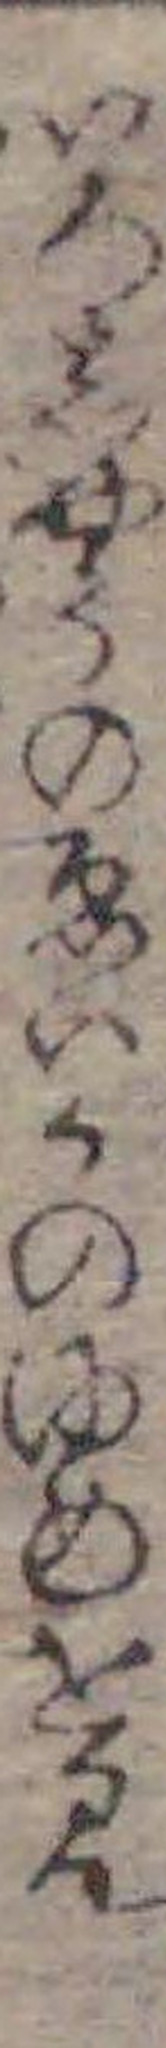いつしやうのゑいかのゆめを見
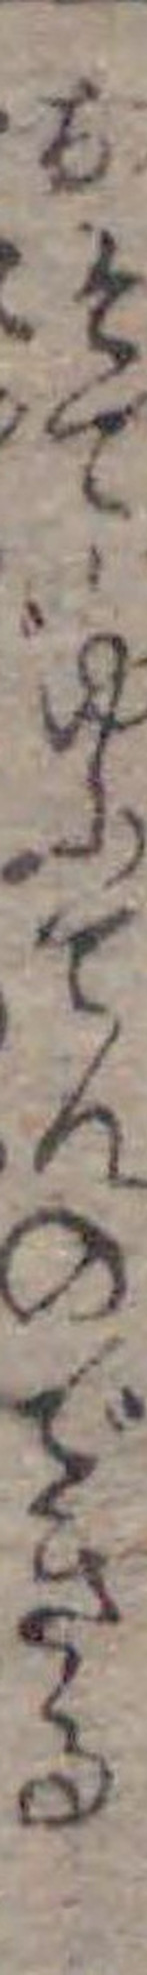おそてはゆふてんのできる
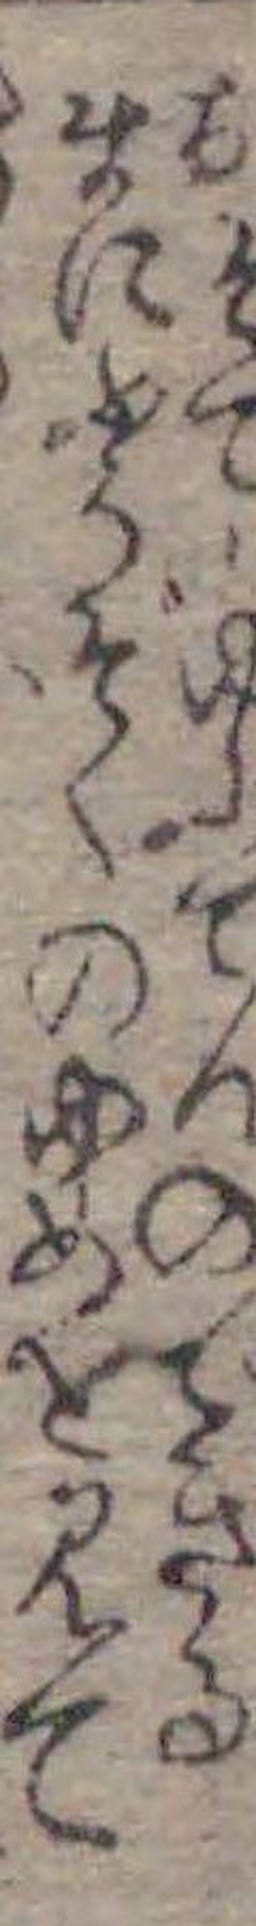まにふうぞくのゆめを見て
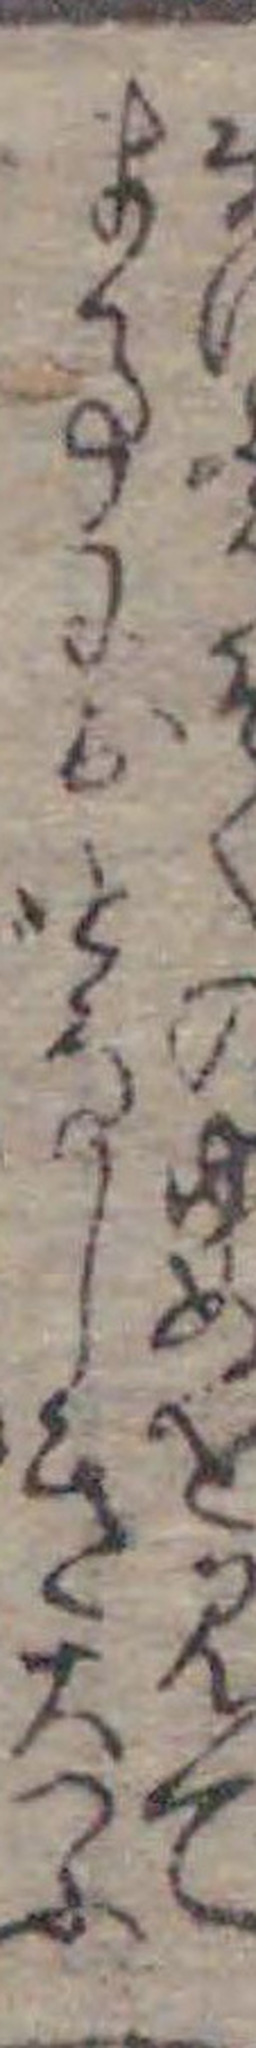よ事におとなしき大つふ
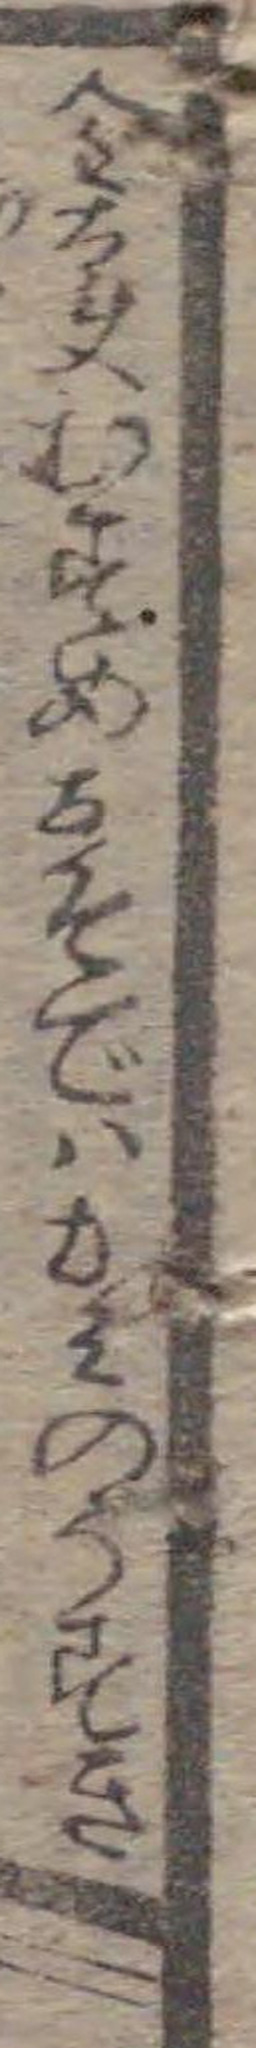金太夫むすめおそではかみのうすき
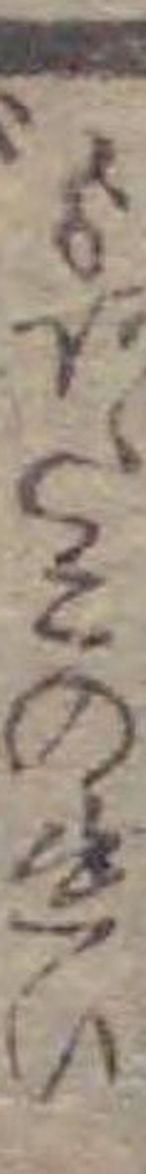もあたこのれい
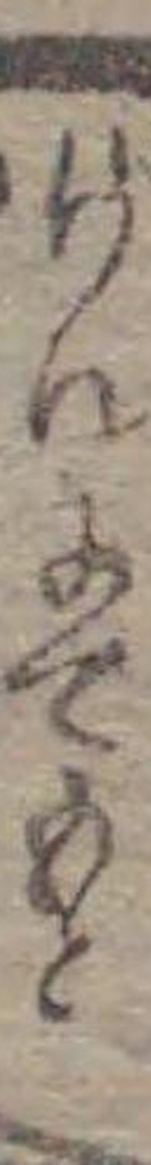げんにてもと
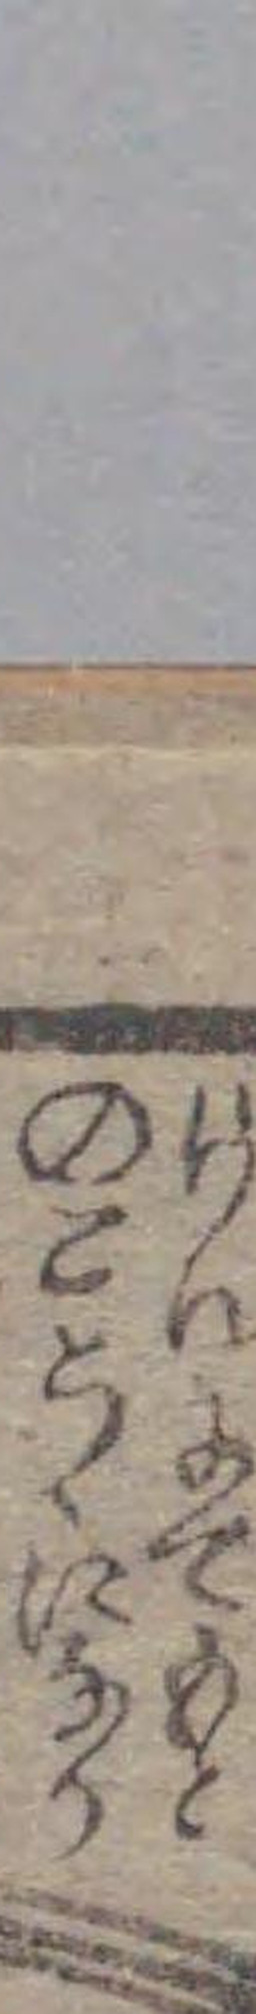のことくになり
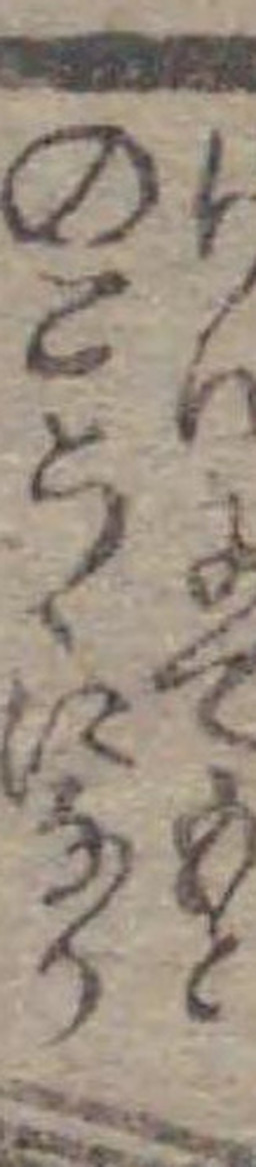のことくになり
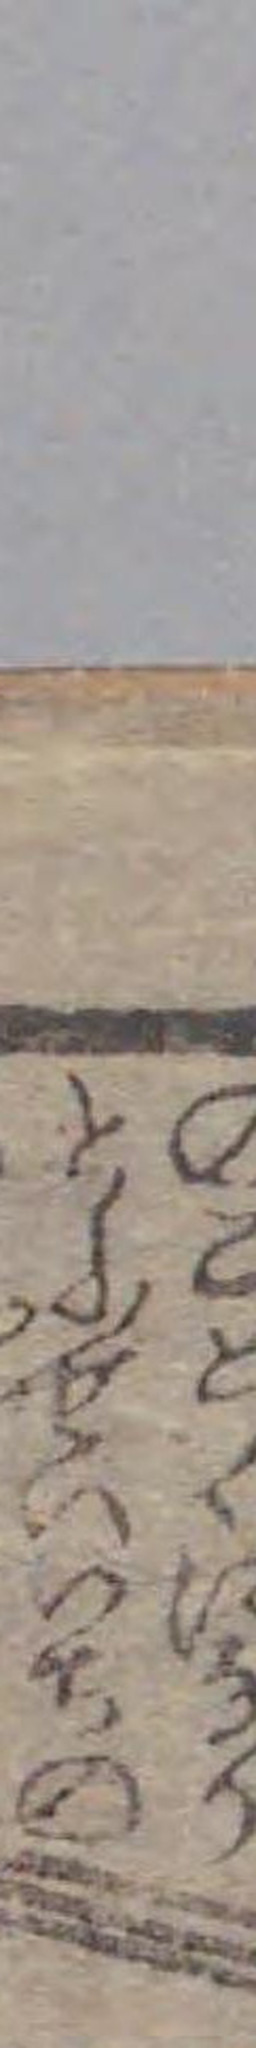とふせいいちの
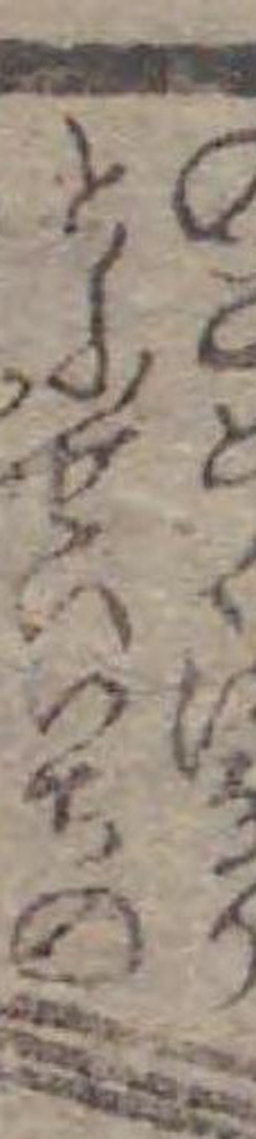とふせいいちの
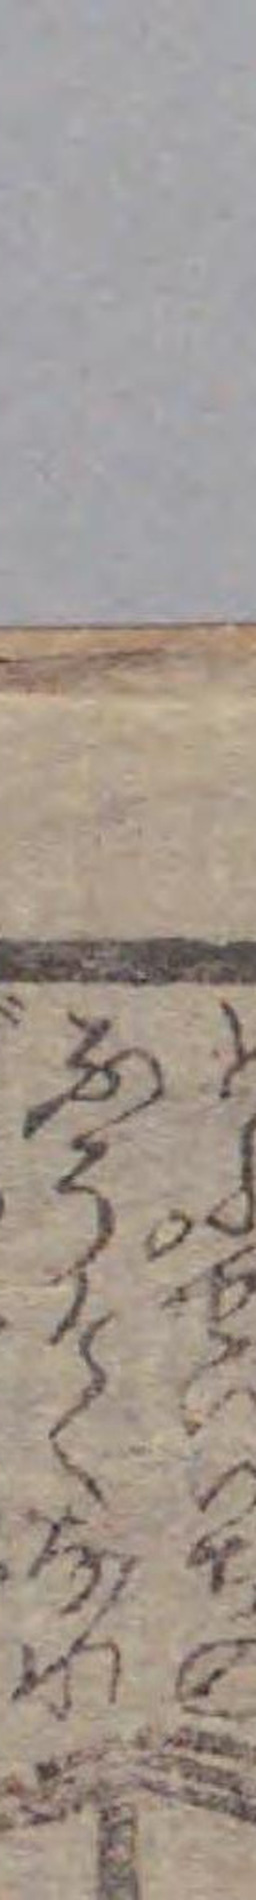ふうそくなれ
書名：神田与吉一代記 : 3巻
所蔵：国立国会図書館 National Diet Library, JAPAN
